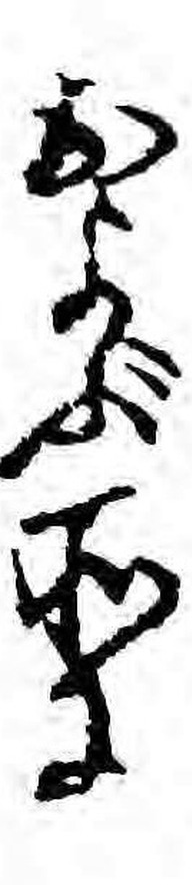およぶ所に
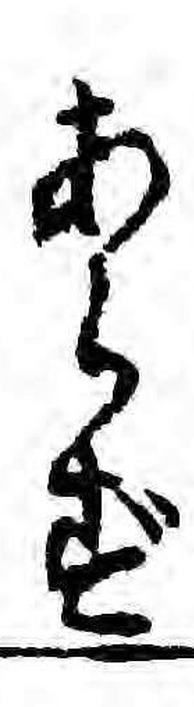あらず
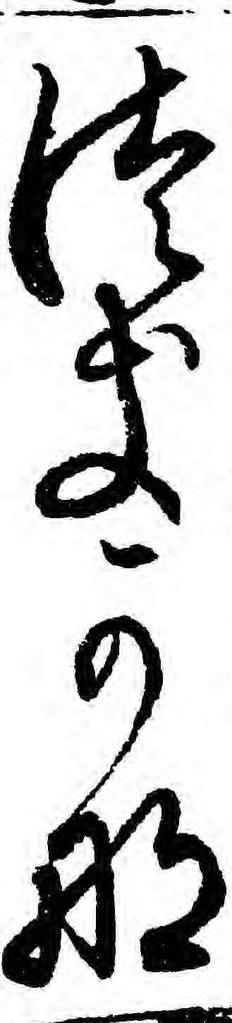つきかな

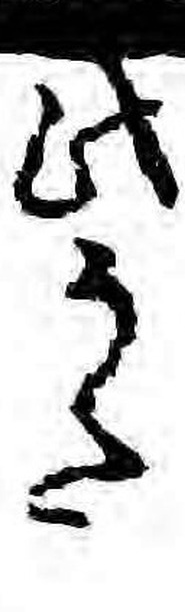此うた
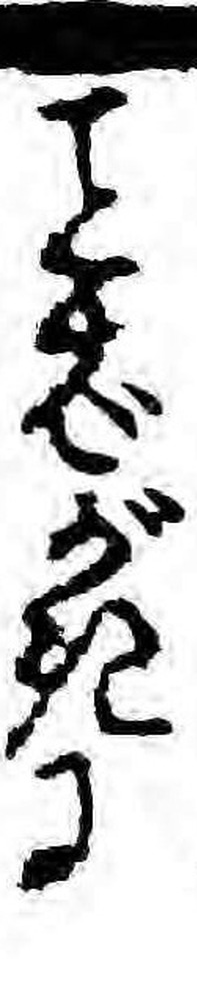ことばがきに
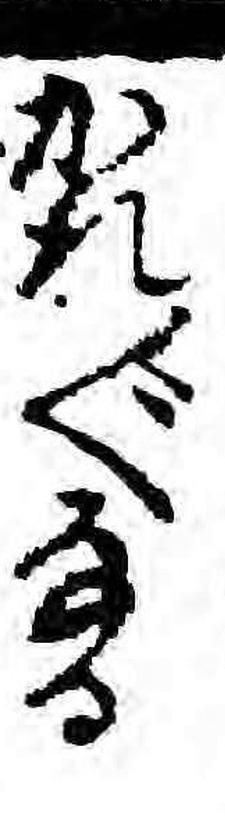かれ〴〵なる
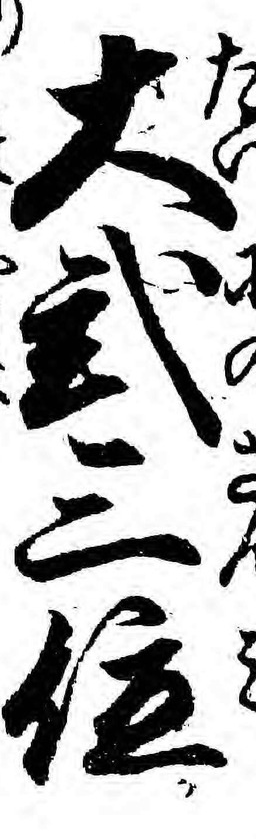大弐三位
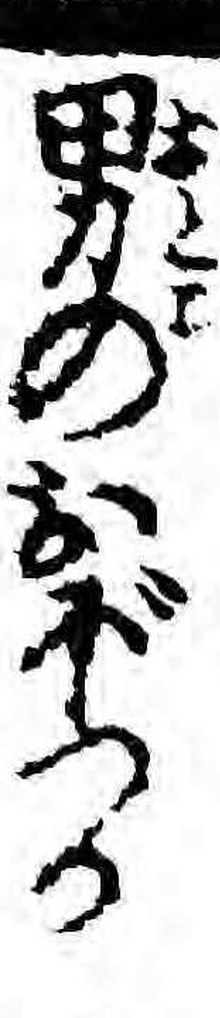男のおぼつか
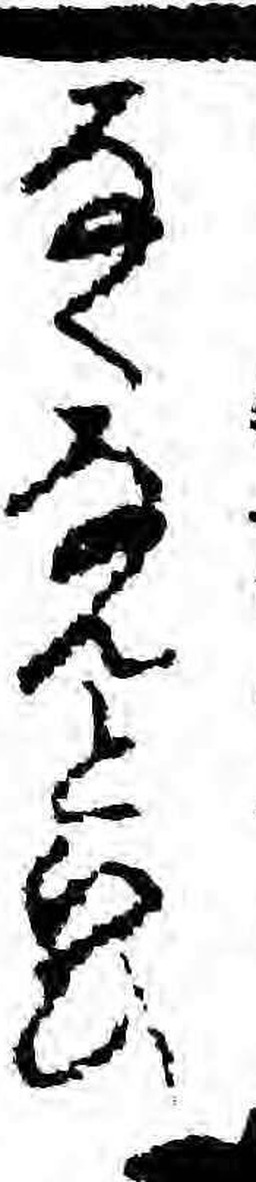なくなんといひ
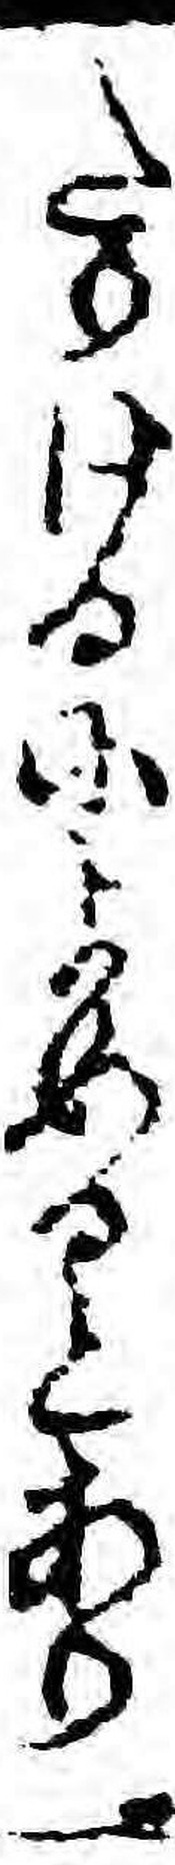たりけるによめるとあり
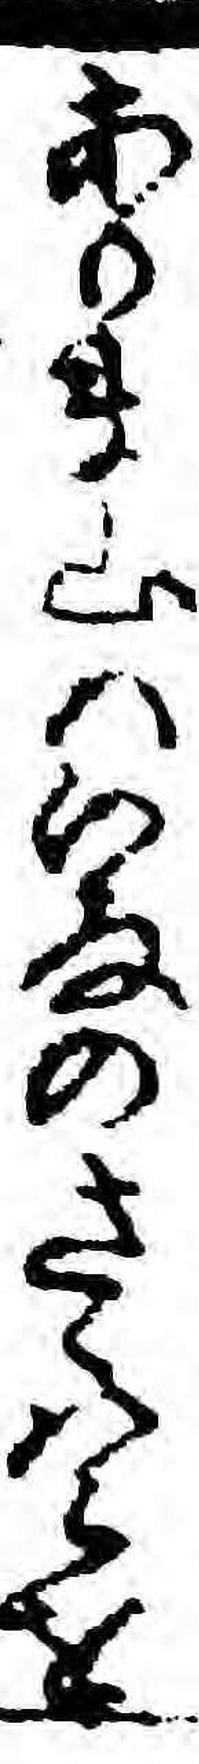ありま山はいなのさゝはらを
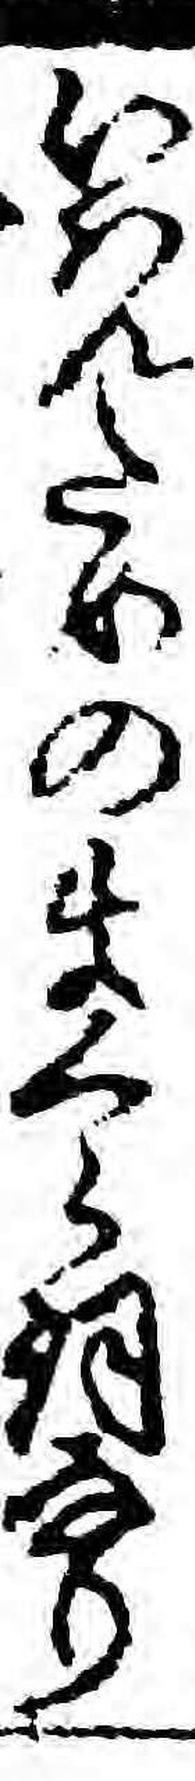いはんためのまくら詞なり
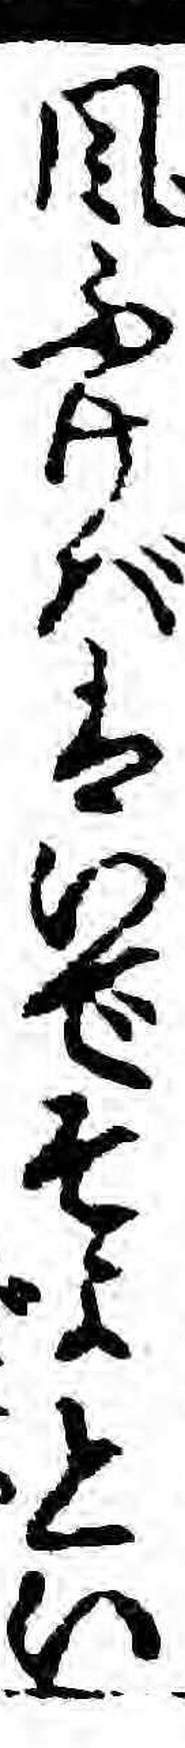風ふけばはいでそよとい
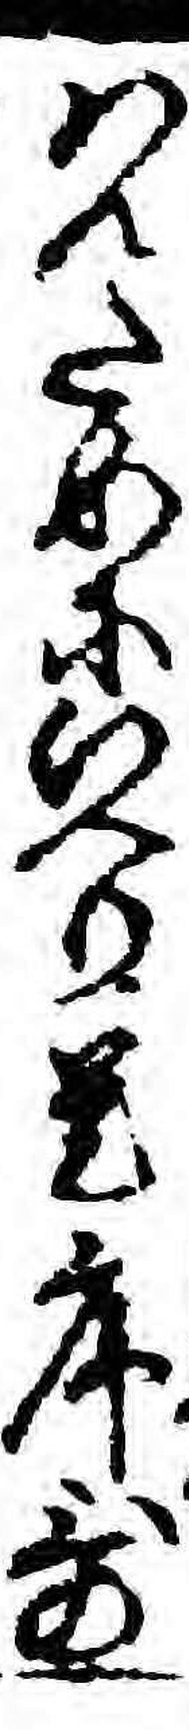はんためにいへり是序哥
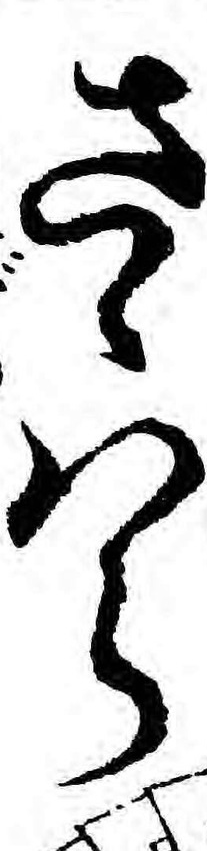さゝはら
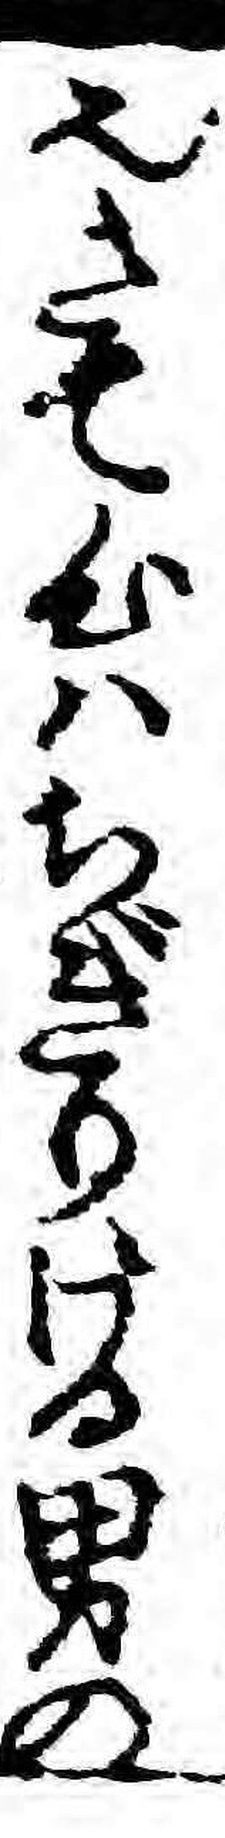也さて心はちぎりける男の
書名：頭書和歌注譯／壽賀多百人一首小倉錦
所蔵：国文学研究資料館
